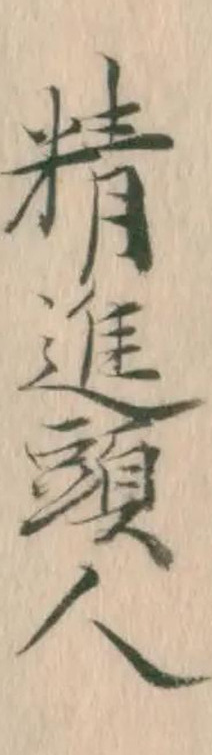精進頭人
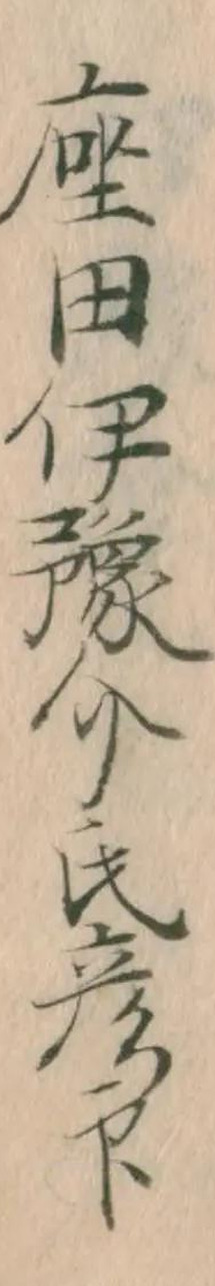座田伊豫介氏彦印
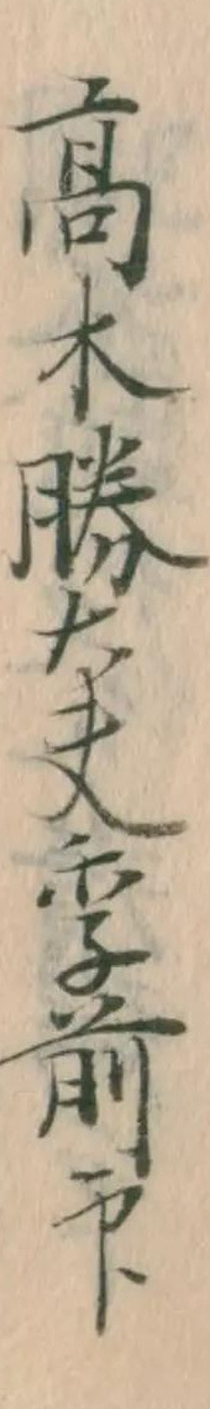高木勝大夫季前印
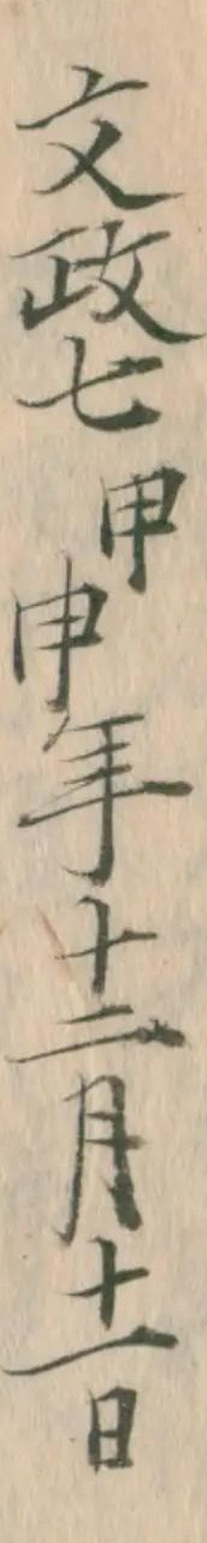文政七甲申年十二月十一日
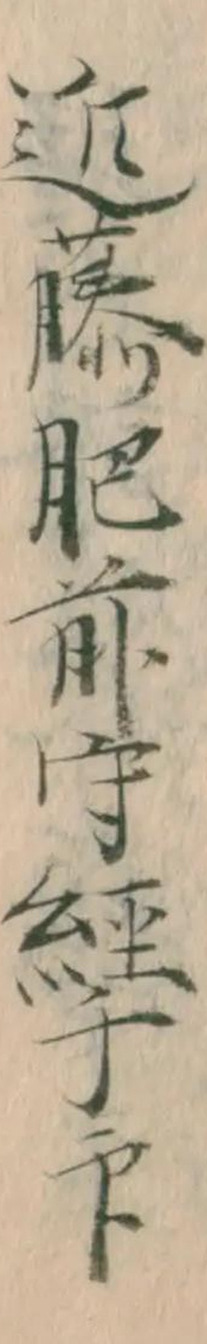近藤肥前守経千印

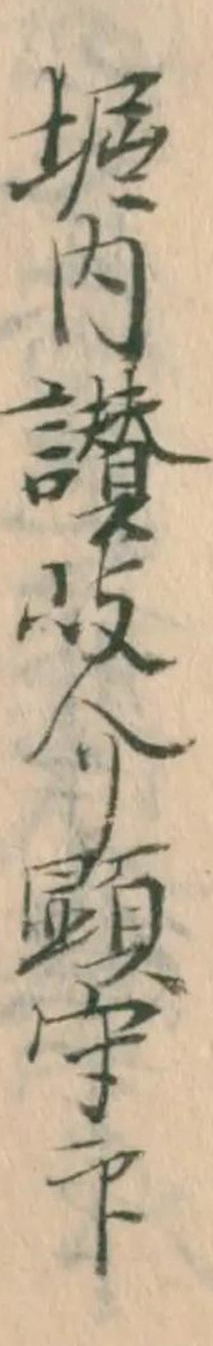堀内讃岐介顕守印
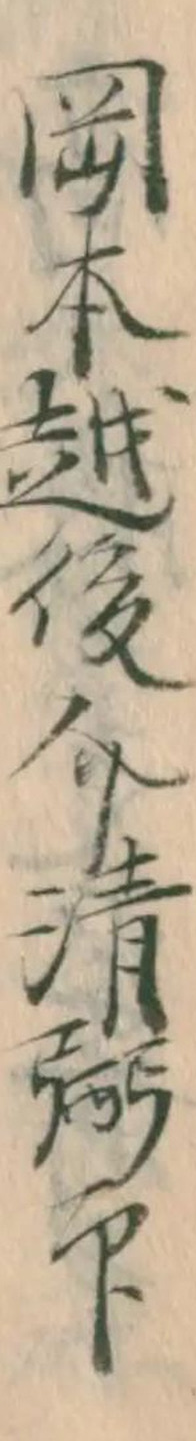岡本越後介清弼印
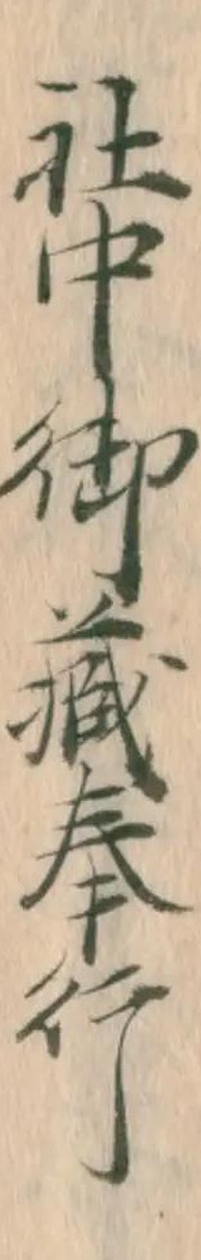社中御蔵奉行
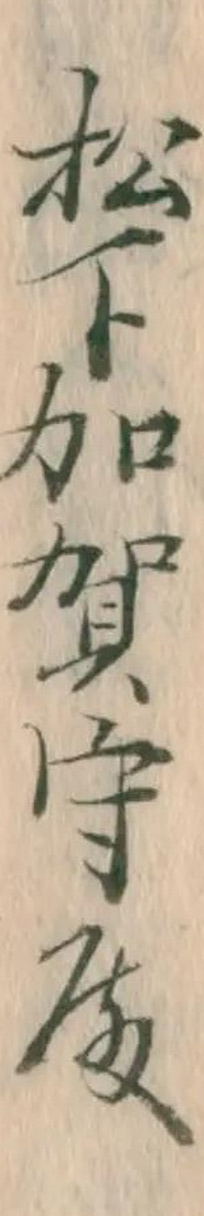松下加賀守殿
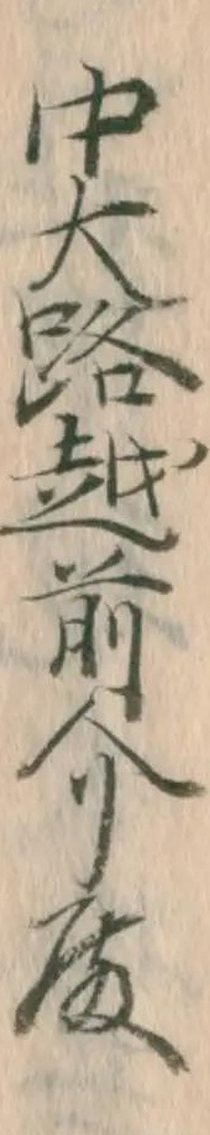中大路越前守殿
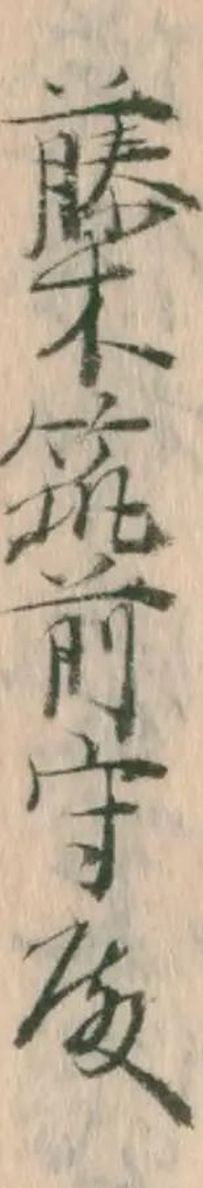藤木筑前守殿
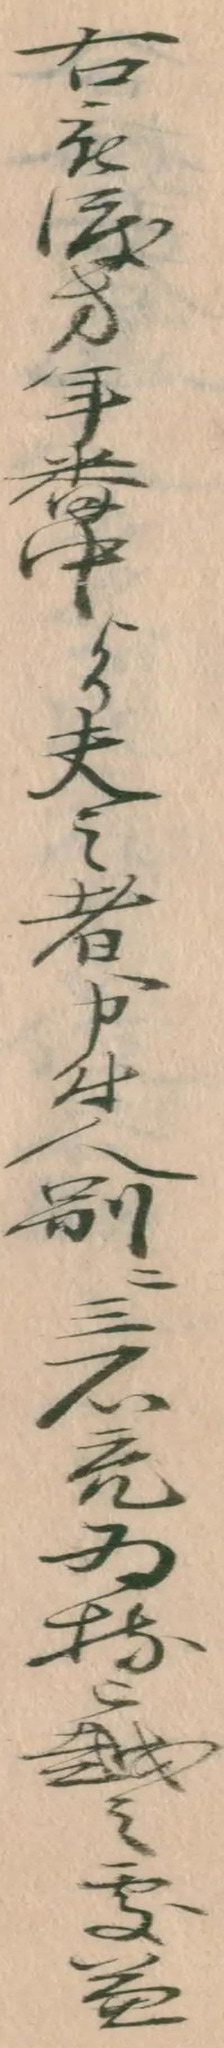右被渡方年番中より夫之者へ申付人別に三石宛為持被越之處兼
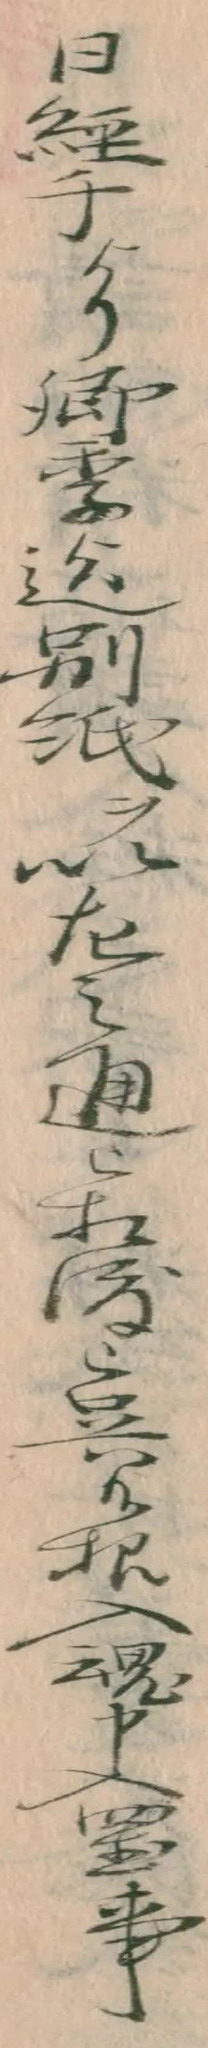日経千より郷季迄別紙ヲ以左之通被相渡被呉候様入魂申入置事
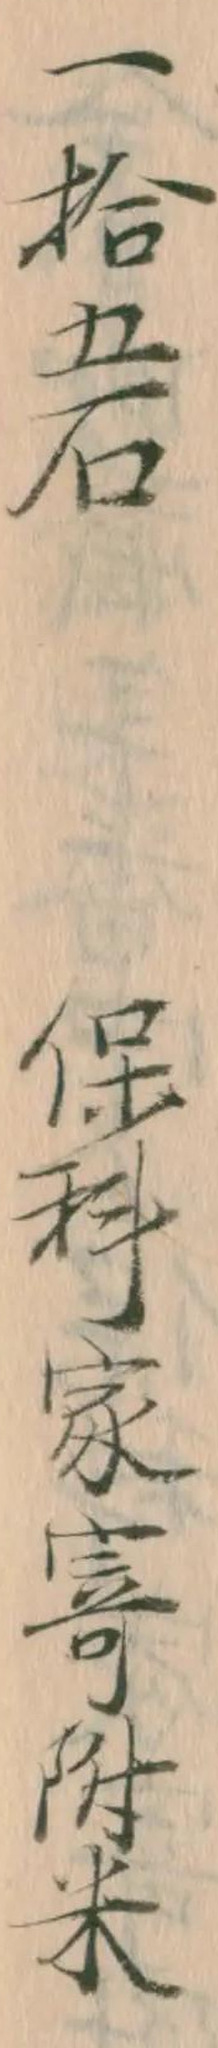一拾五石保科家寄附米
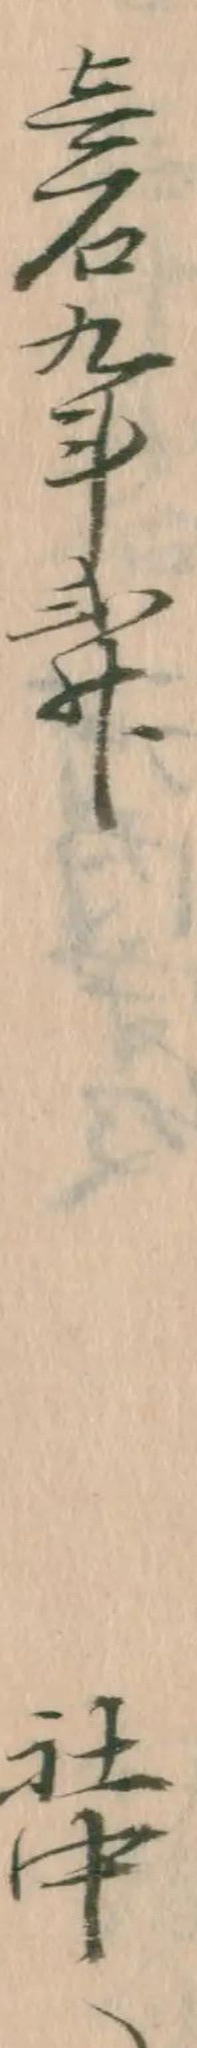壱石九斗弐升社中へ
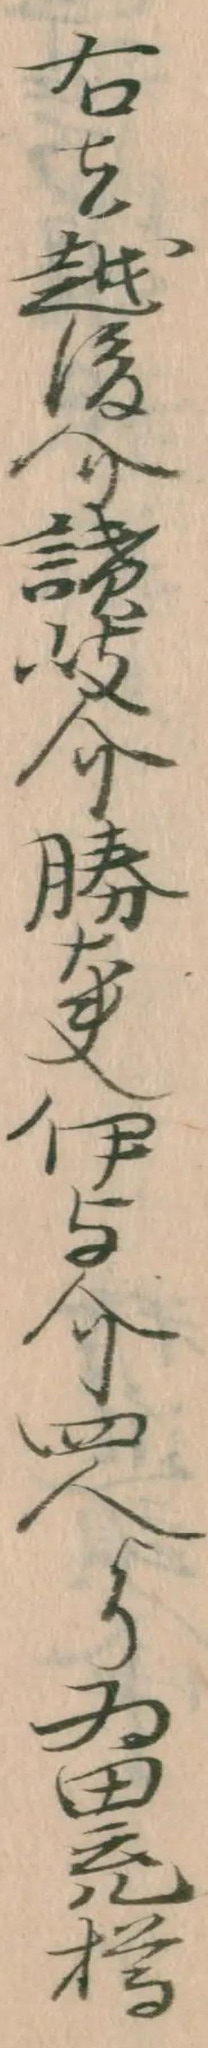右は越後介諸岐介勝大夫伊与介四人より為田充樽
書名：賀茂社記録. 第74冊
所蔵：国立国会図書館 National Diet Library, JAPAN
